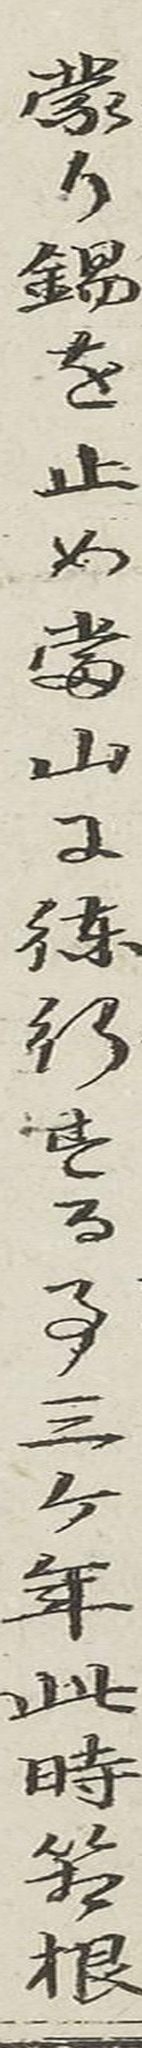蒙り錫を止め當山に練行する事三ケ年此時箱根
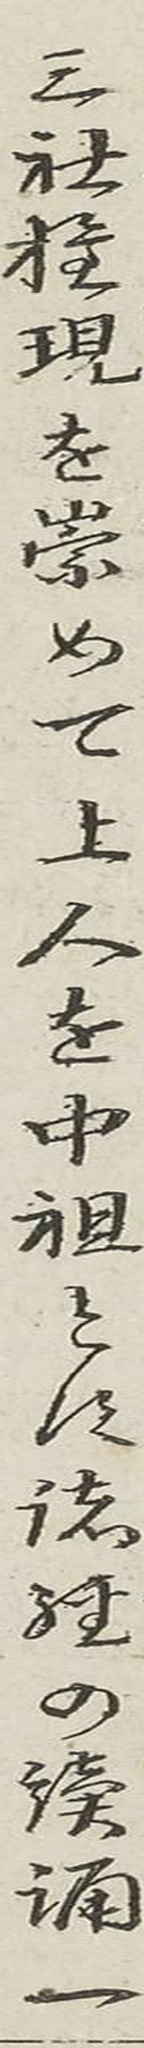三社権現を崇めて上人を中祖とす諸経の読誦一
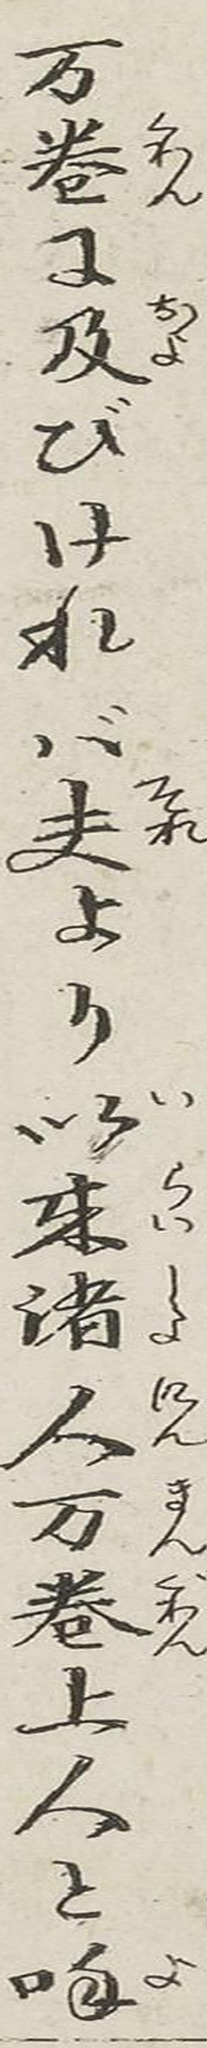万巻に及びければ夫より以来諸人万巻上人と呼
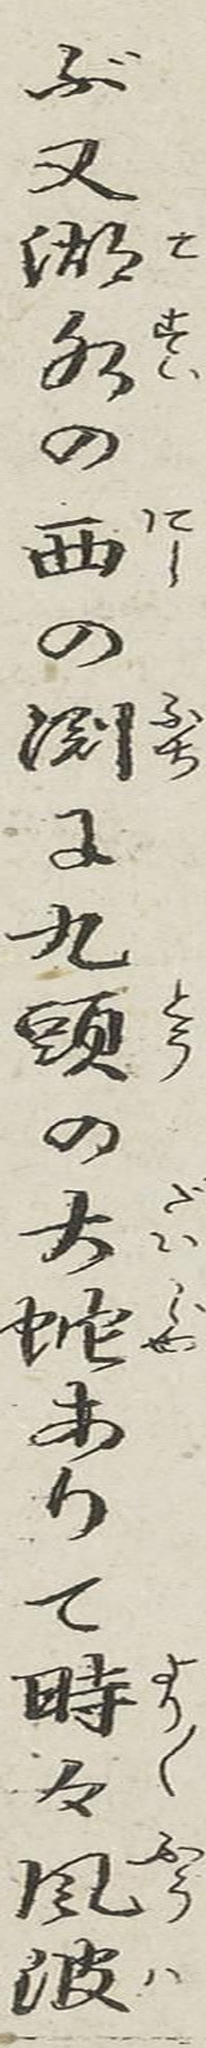ぶ又湖水の西の渕に九頭の大蛇ありて時々風波
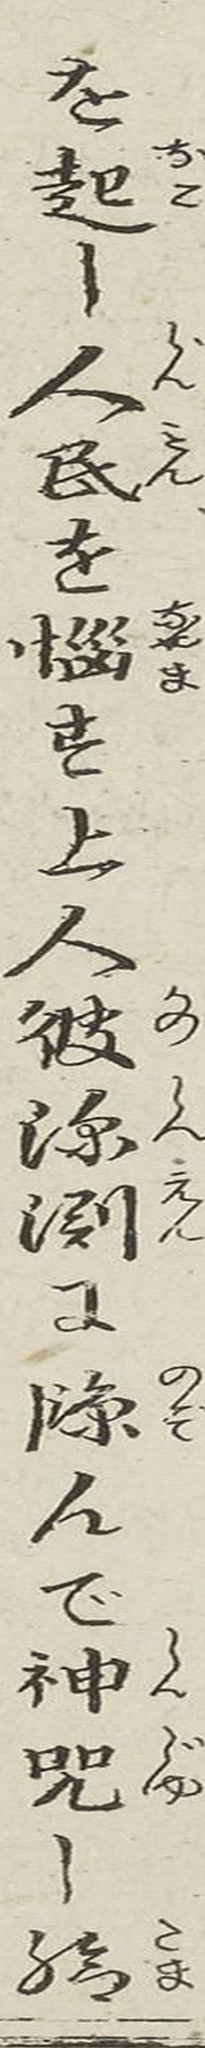を起し人民を悩す上人彼深渕に臨んで神咒し給
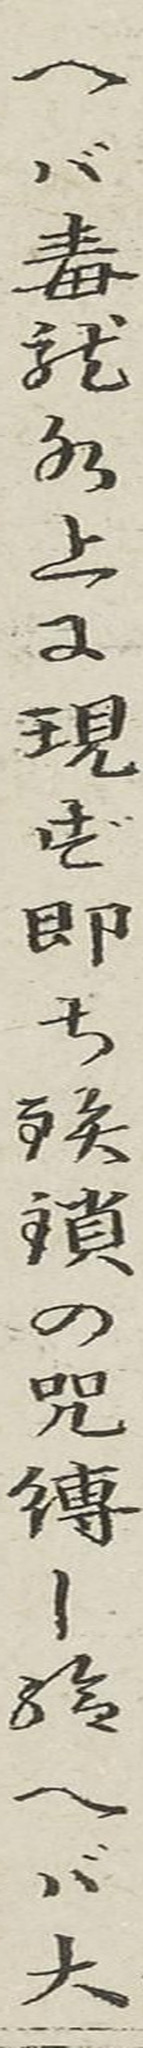へば毒龍水上に現ず即ち鉄鎖の咒縛し給へば大
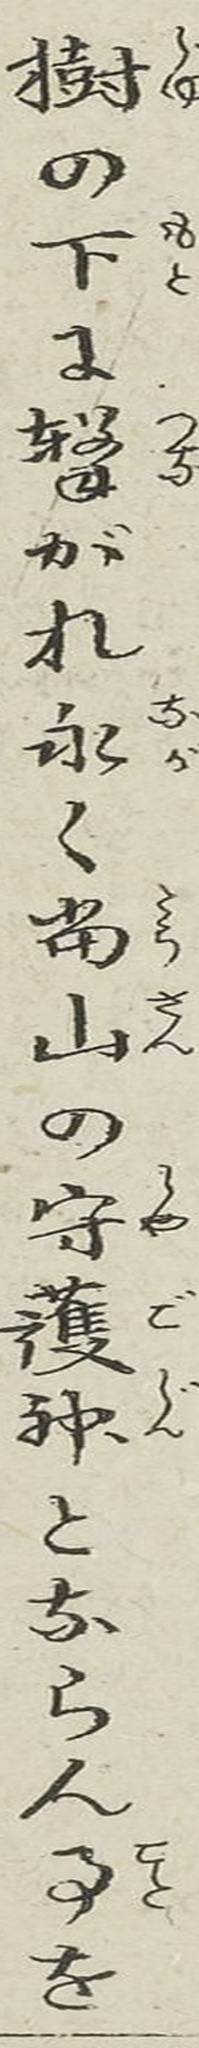樹の下に繋がれ当山の守護神とならん事を

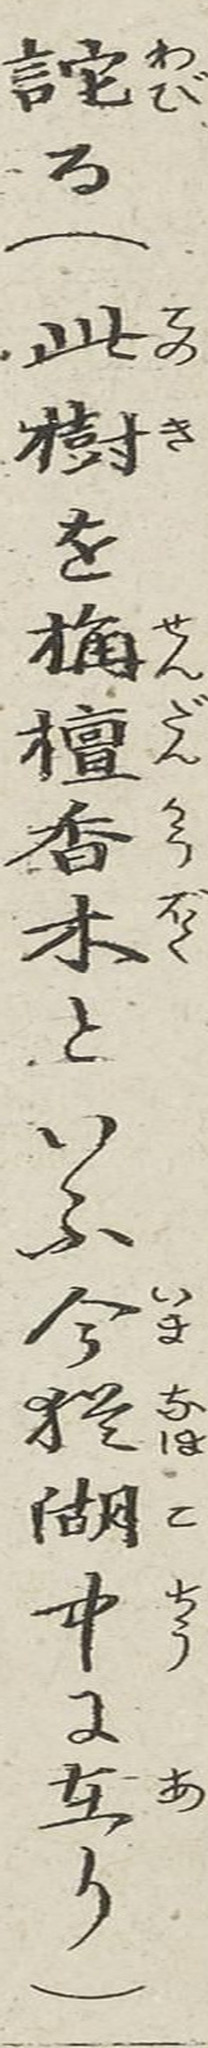詫るを栴檀香木といふ今猶湖中に在り）
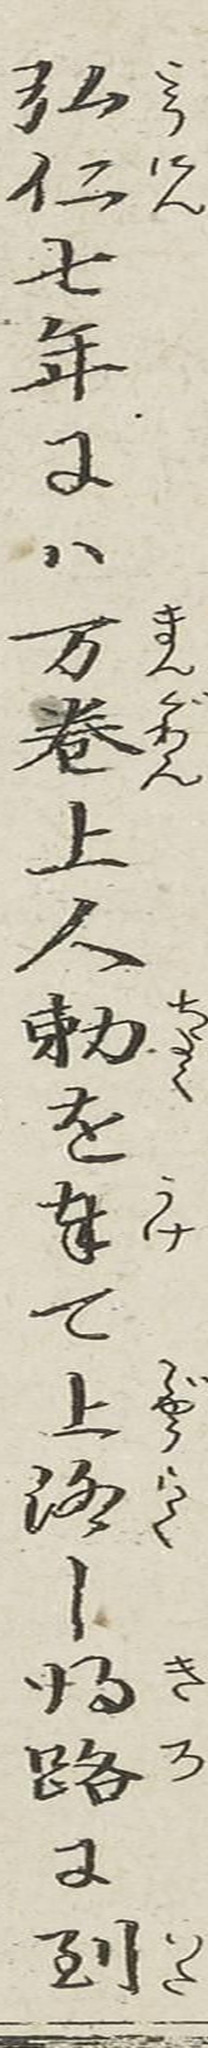弘仁七年には万巻上人勅を奉て上洛し帰路に到
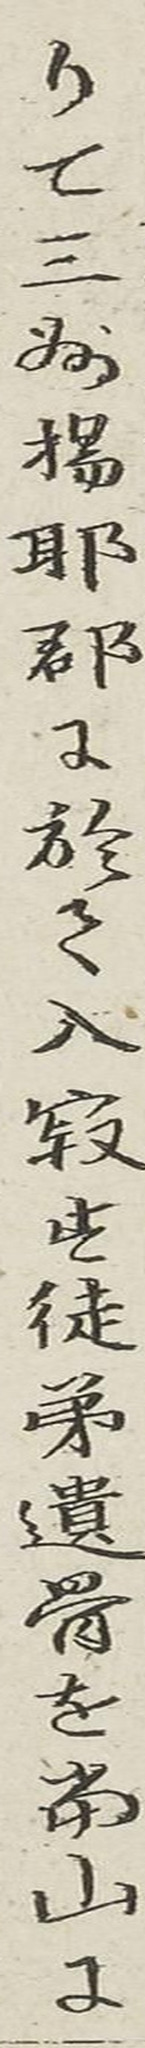りて三州楊耶郡に於て入寂す徒弟遺骨を当山に
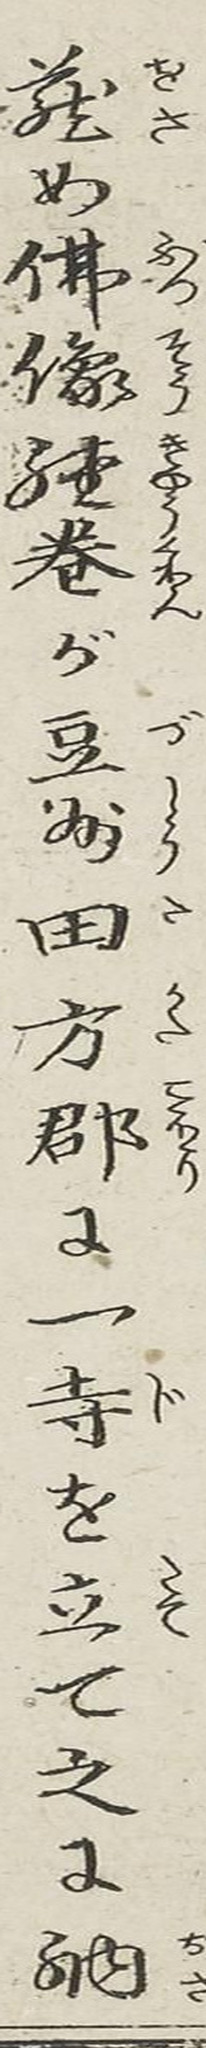蔵め仏像経巻が豆州田方郡に一寺を立て之に納
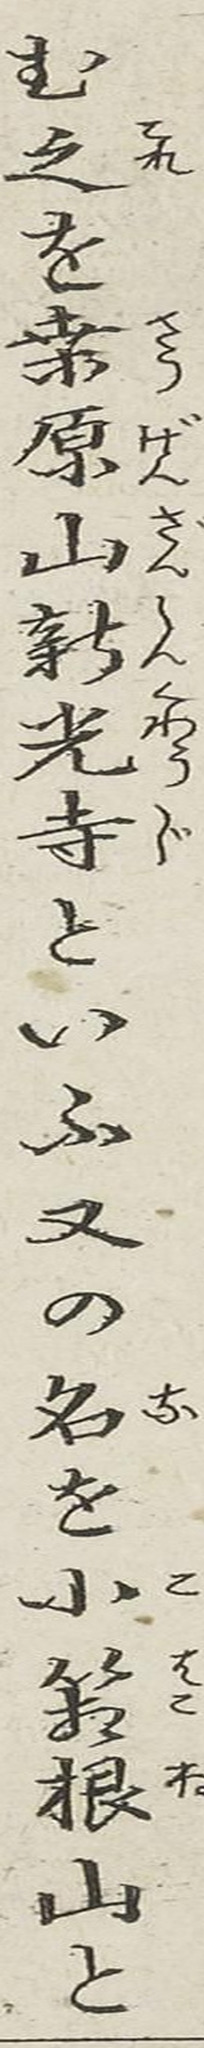む之を桑原山新光寺といふ又の名を小箱根山と
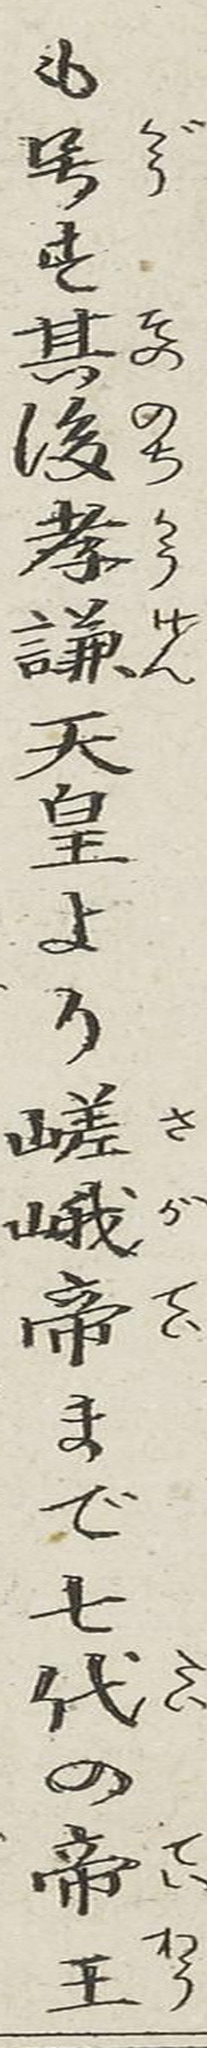も号す其後孝謙天皇より嵯峨帝まで七代の帝王
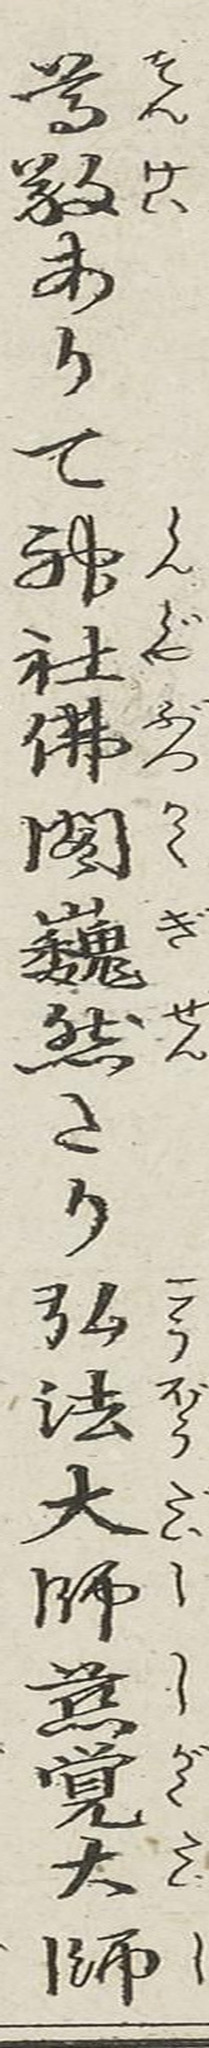尊敬ありて神社仏閣巍然たり弘法大師慈覚大師
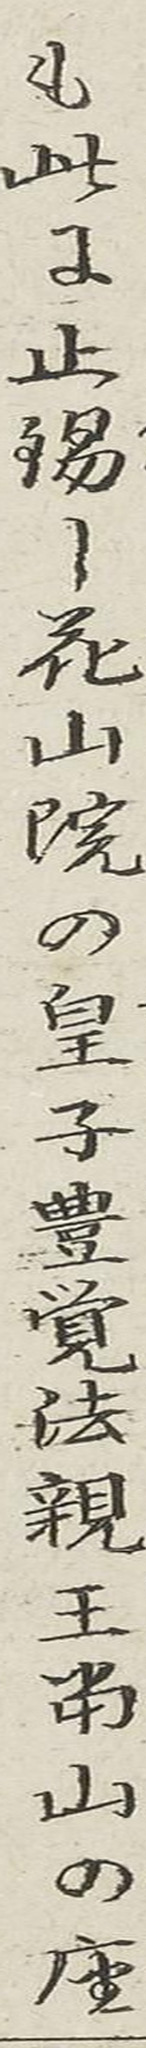も此に止錫し花山院の皇子豊覚法親王当山の座
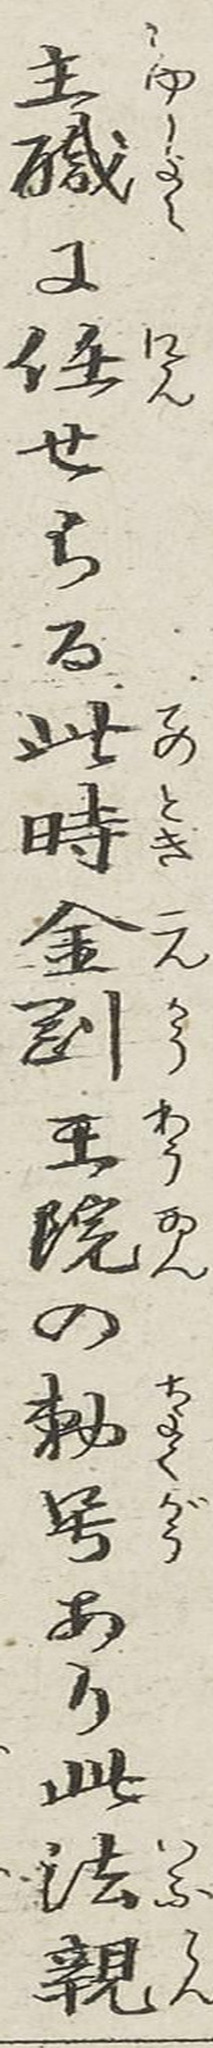主職に任せらる此時金剛王院の勅号あり此法親
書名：箱根温泉誌　全
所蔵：東京大学地震研究所図書室 Earthquake Research Institute Library, The University of Tokyo, JAPAN
